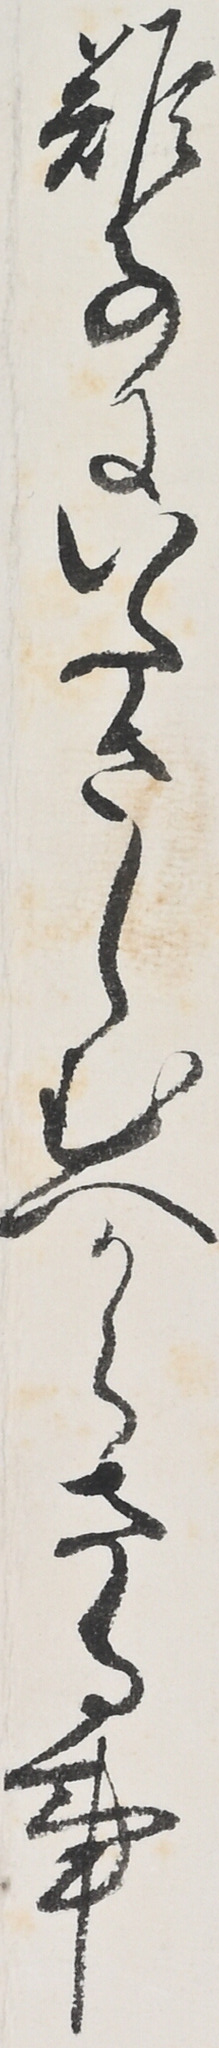難事にいたさしむへからさる事
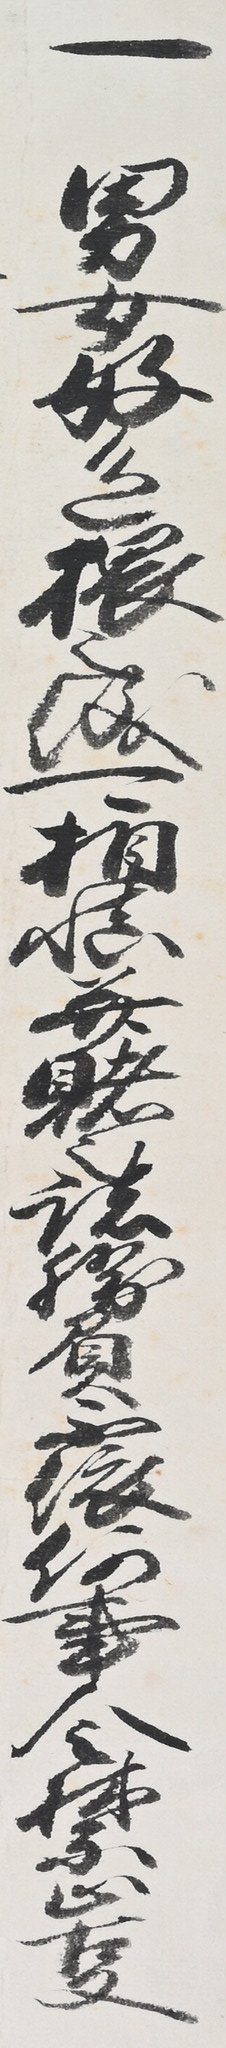一男女好色猥之儀可相慎幷賭之諸勝負不依何事令禁止事
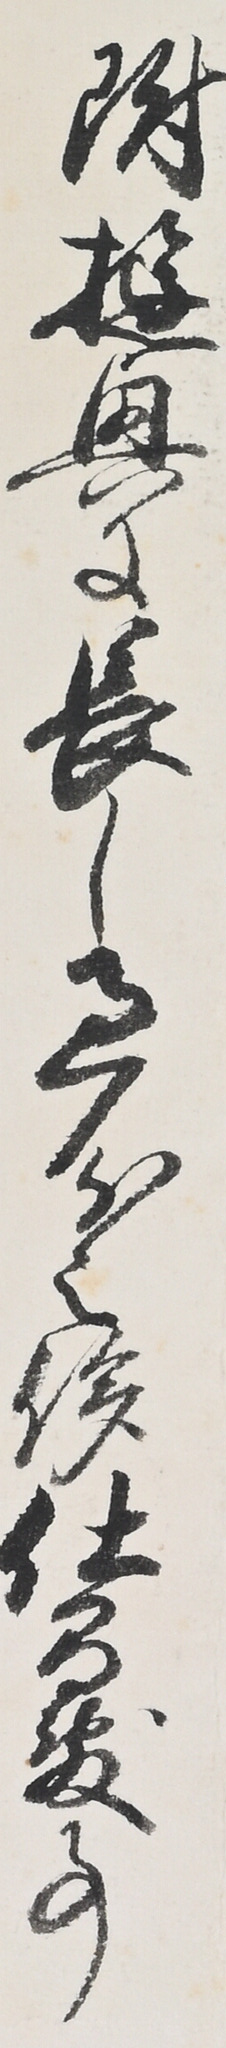附遊興に長し過分之侈仕間敷事
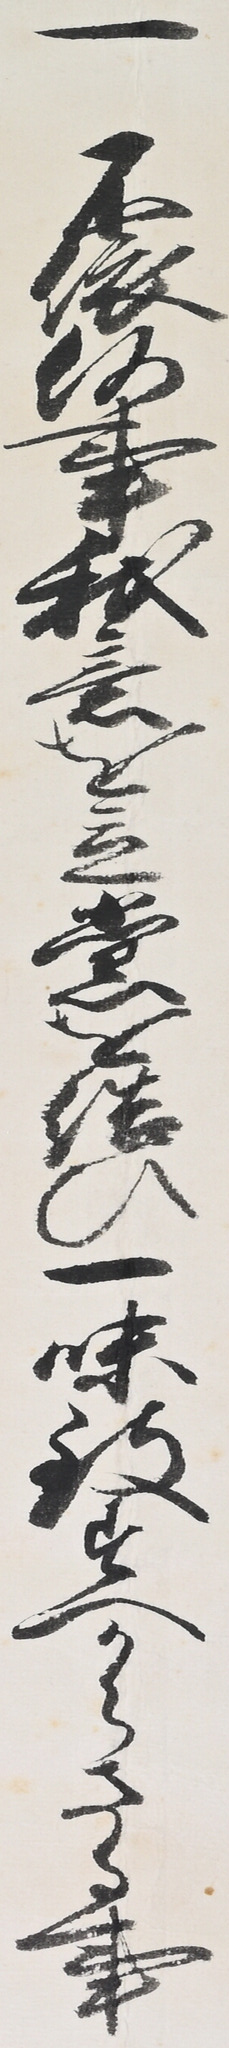一不依何事我意を立党を結ひ一味致すへからさる事
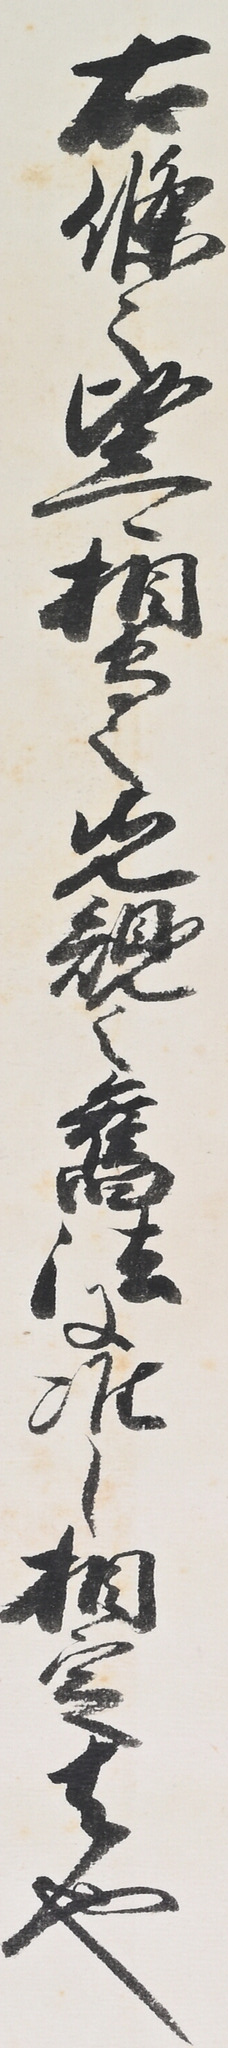右條々堅可相守之先規之旧法に准し相定者也
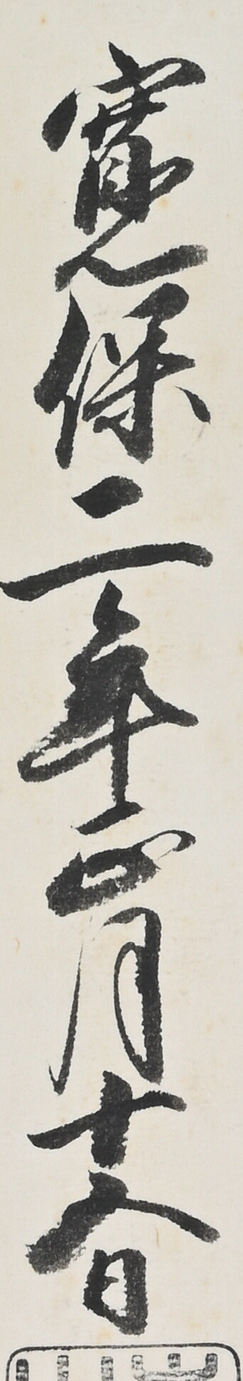寛保二年正月十五日

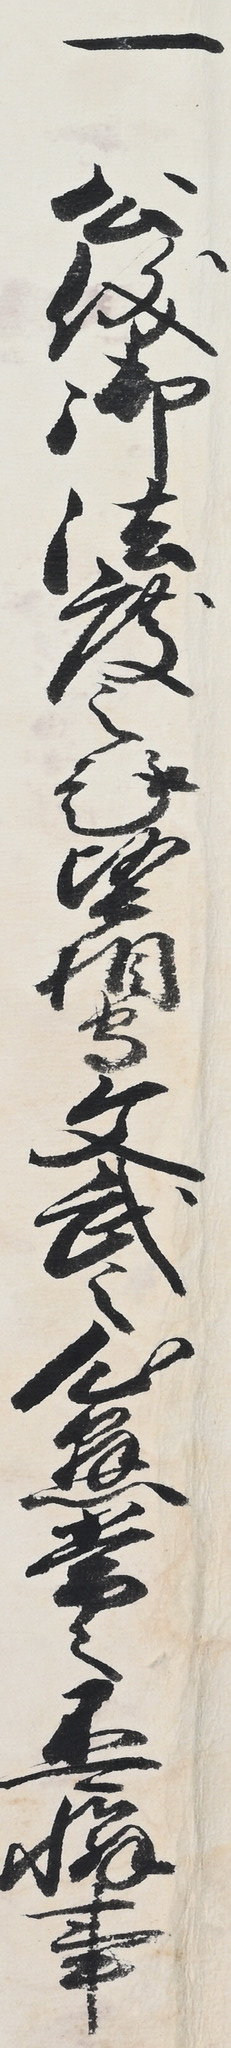一公儀御法度之趣堅相守文武之心懸常々不可懈事
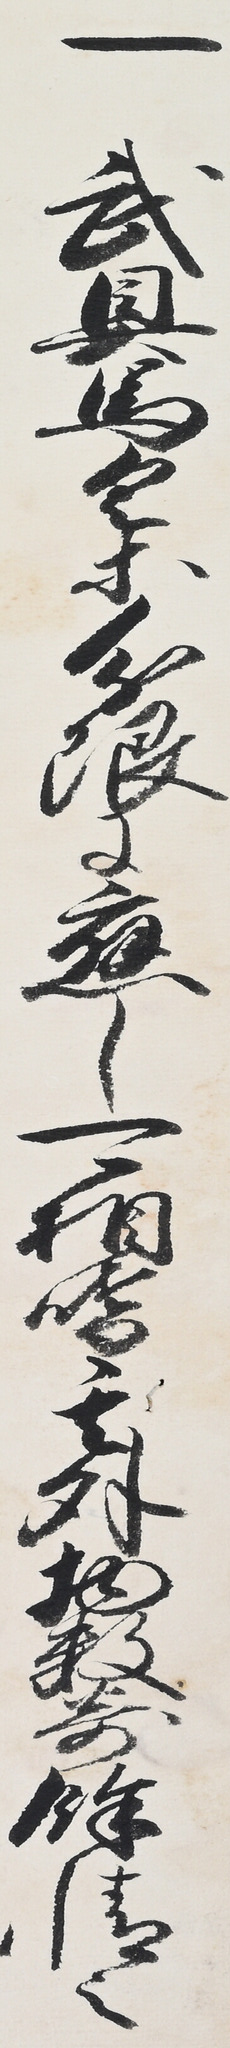一武具馬具等分限に応し可相嗜其外物数寄余情之
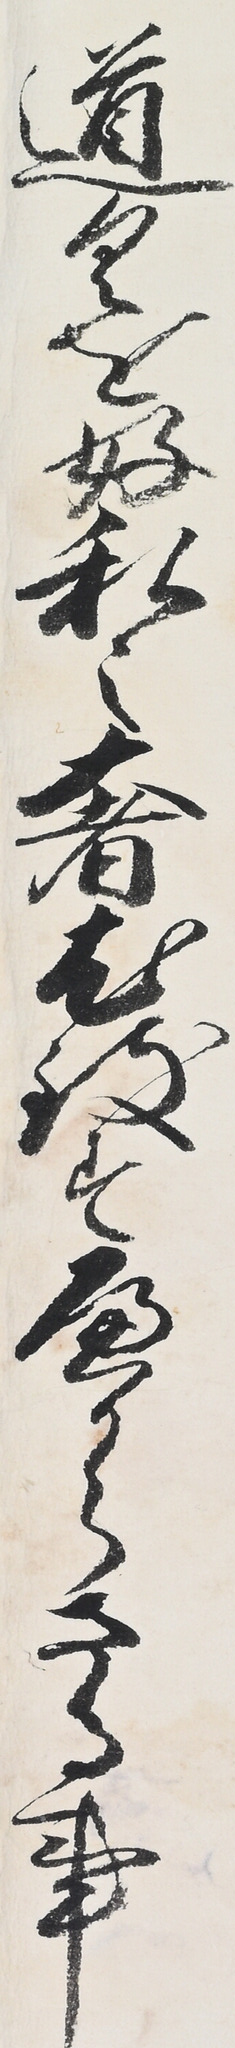道具を好私之奢尤致すへからさる事
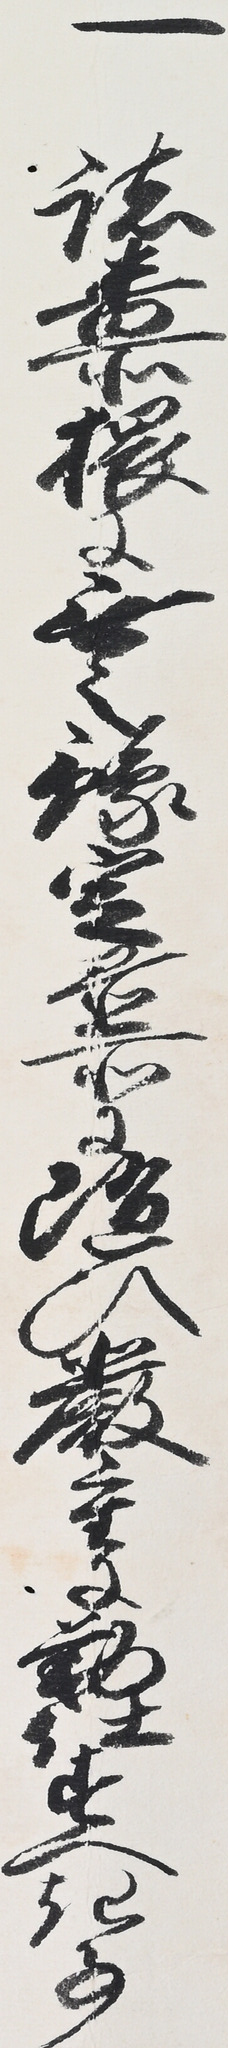一諸番所猥に無之予定置所に随ひ厳重に勤仕すへき事
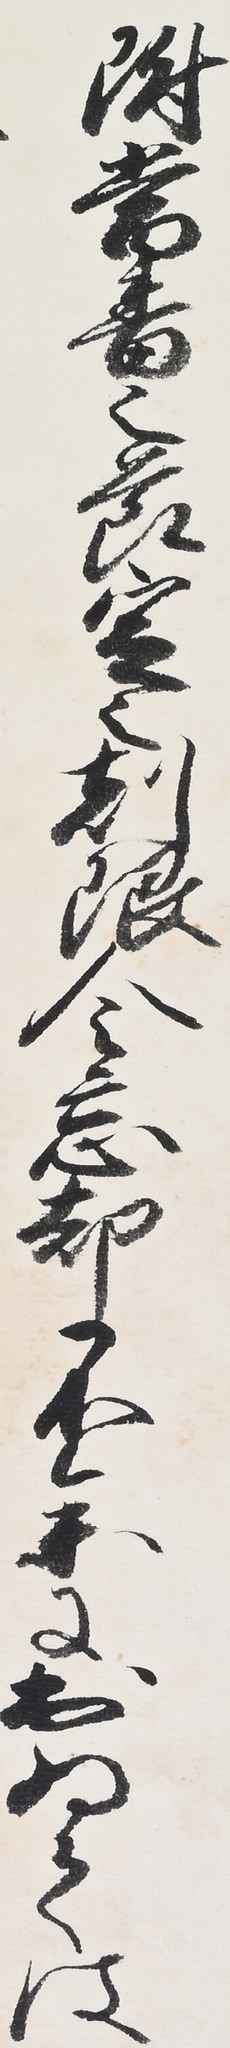附当番之節定之刻限令忘却不参におゐてハ
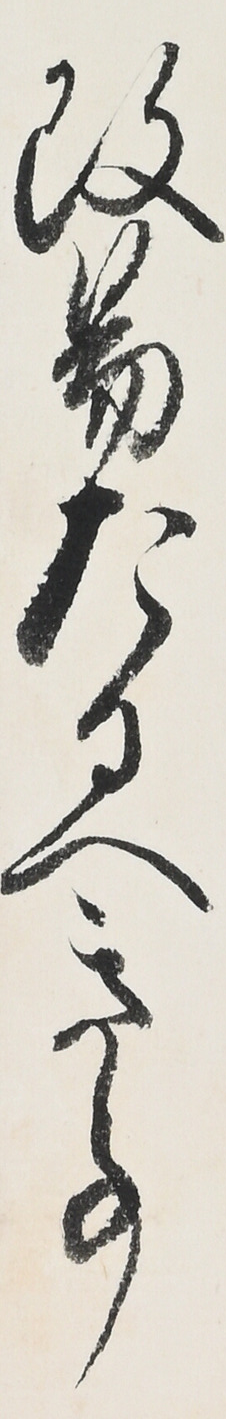改易たるへき事
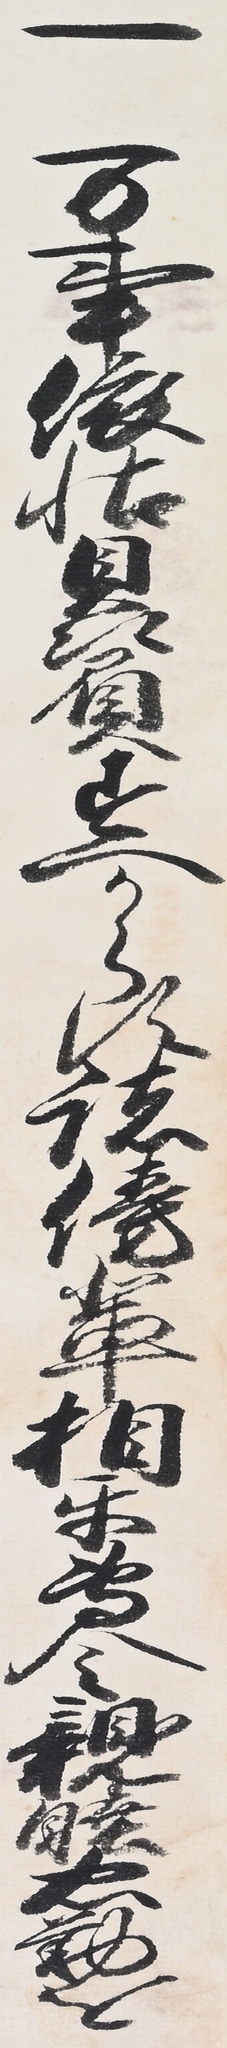一万事依怙贔屓すへからす諸傍輩相互専令親睦忠勤を
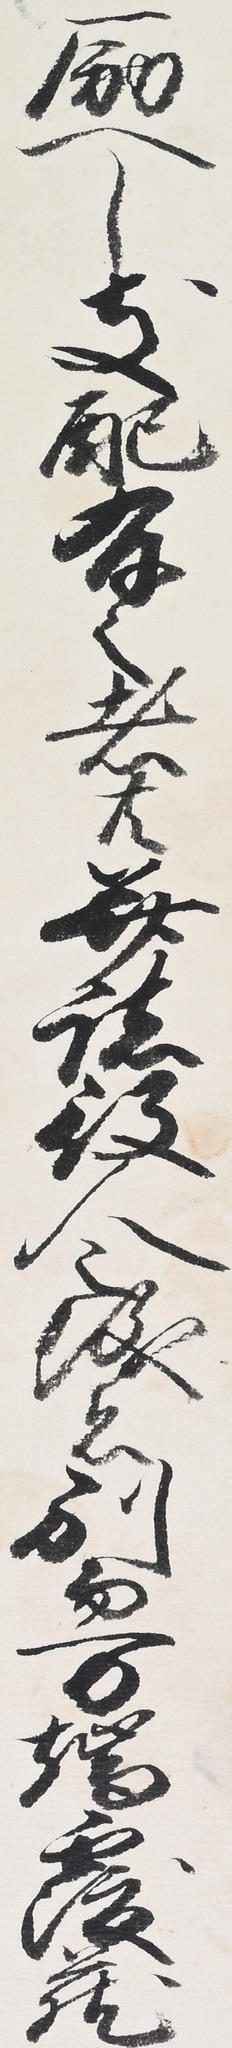励へし支配有之者共幷諸役人之儀者別而万端覆蔵
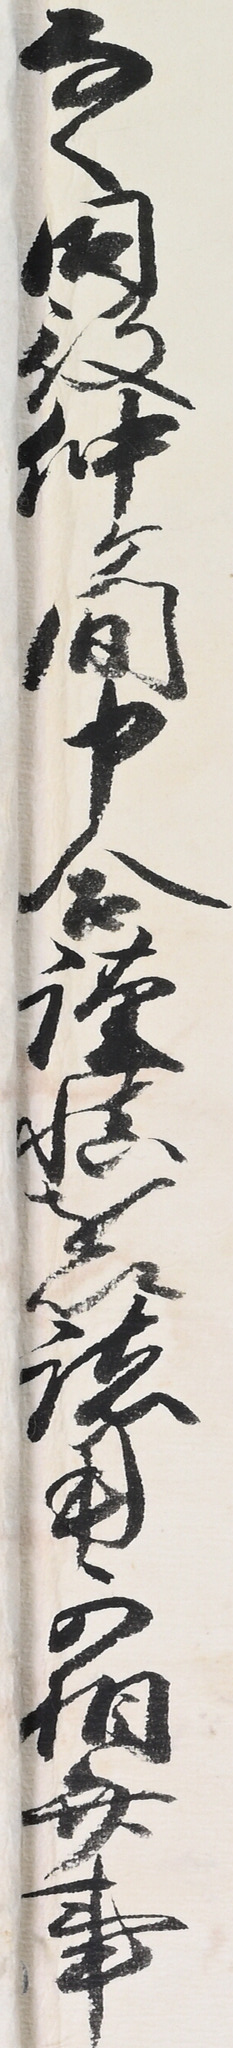なく同役仲ヶ間申合謹慎を以諸用可相弁事

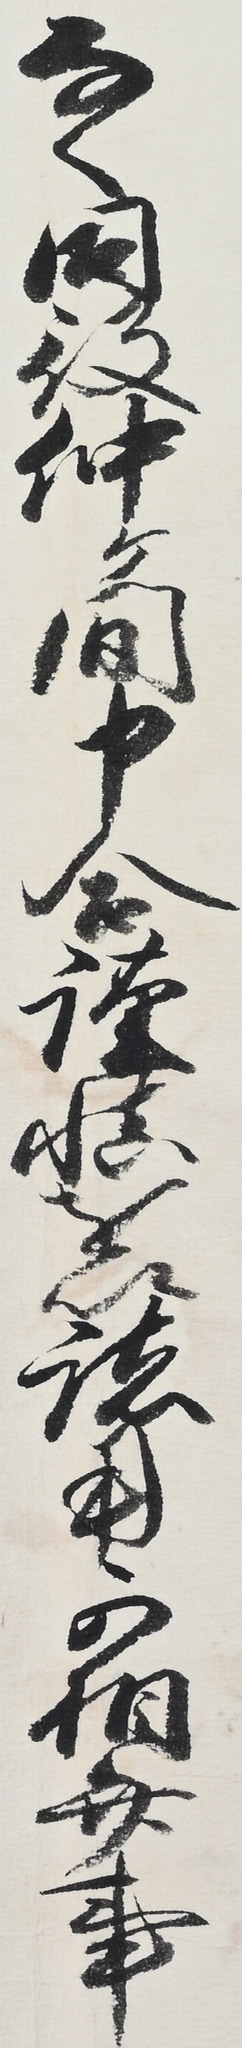なく同役仲ヶ間申合謹慎を以諸用可相弁事
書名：御条目〔同文二通一括〕
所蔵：伊那市立高遠町図書館・合同会社AMANE
